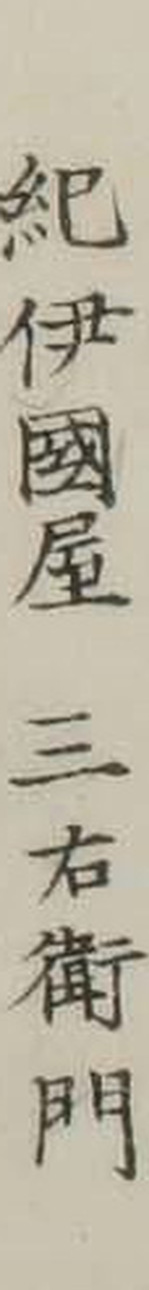同紀伊國屋三右衛門
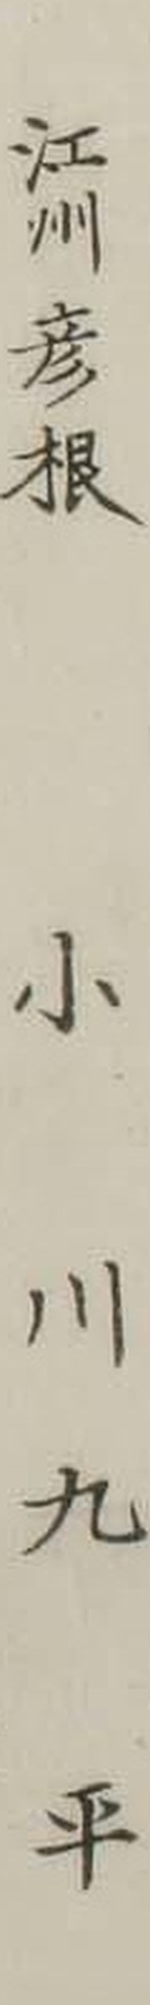江州彦根小川九平
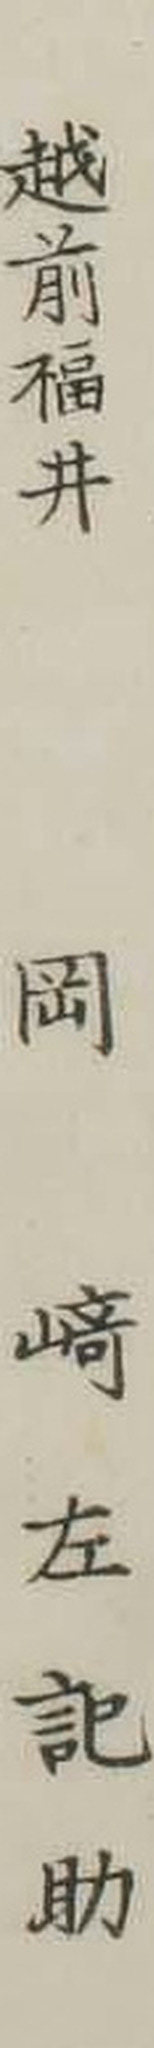越前福井岡﨑左記助
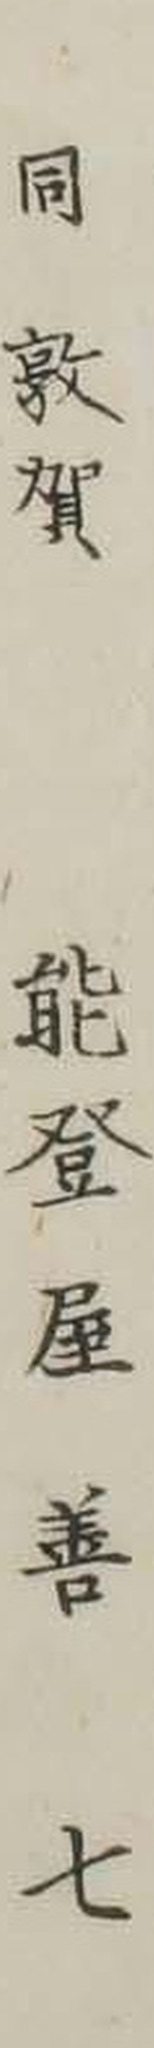同敦賀能登屋善七
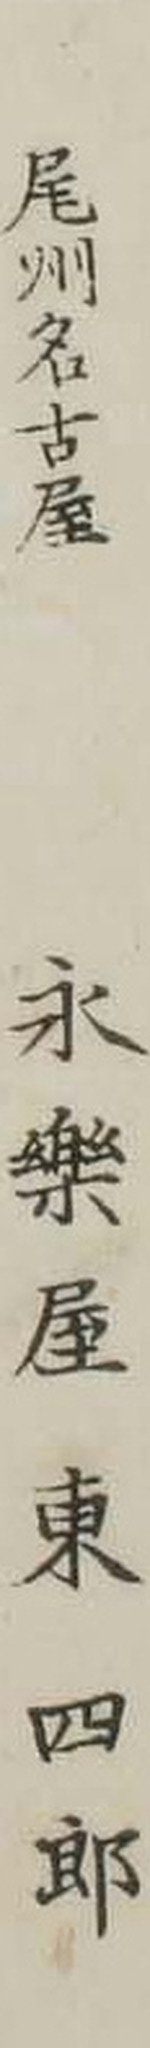尾州名古屋永樂屋東四郎
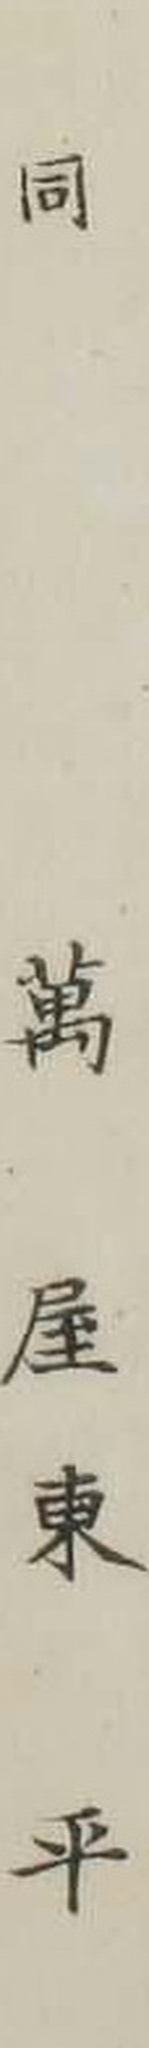同萬屋東平
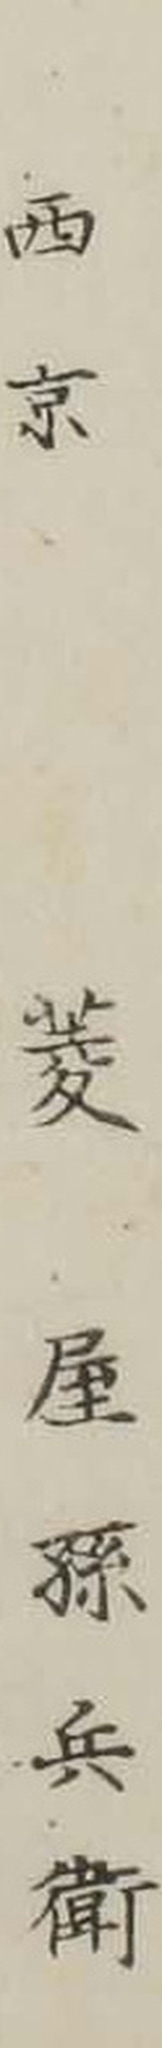西京菱屋孫兵衛
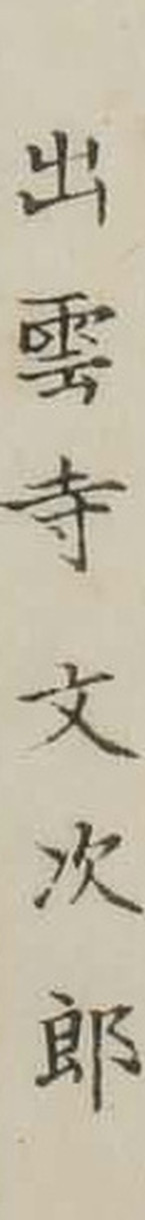出雲寺文次郎
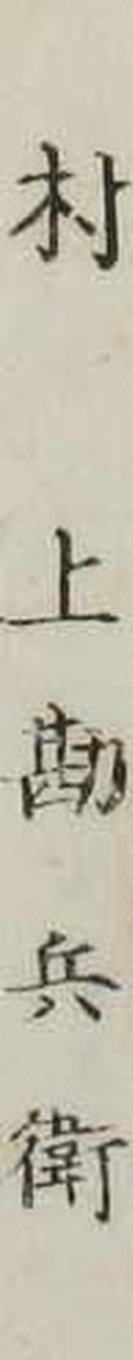村上勘兵衛
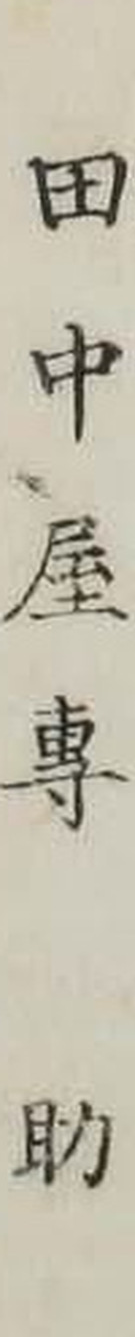田中屋專助
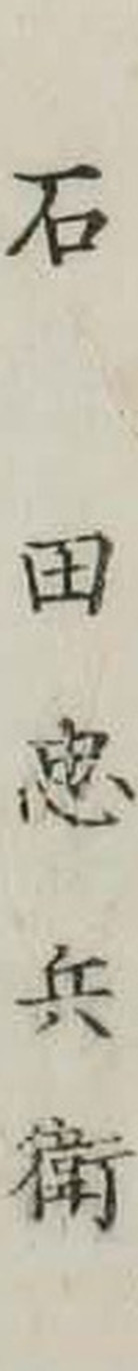石田忠兵衛
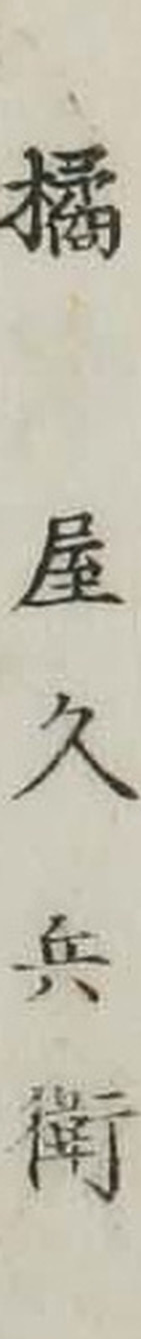橘屋九兵衛
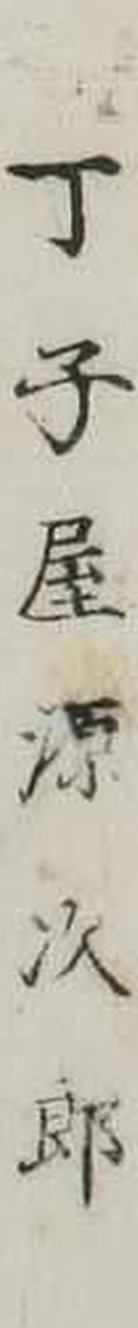丁子屋源次郎
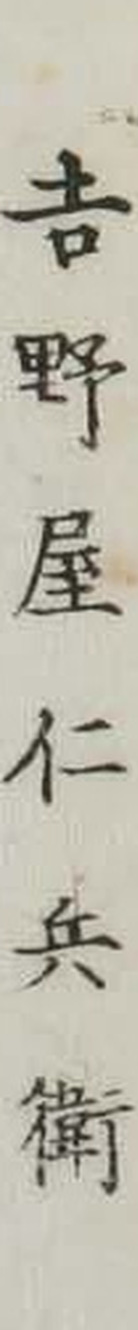吉野屋仁兵衛
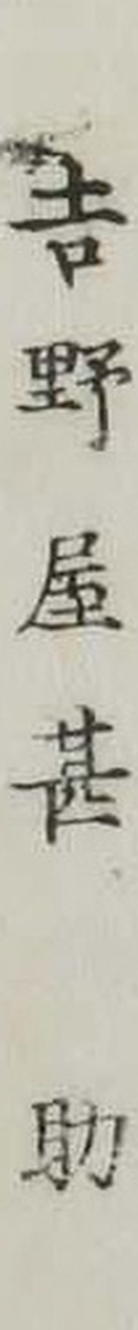吉野屋甚助
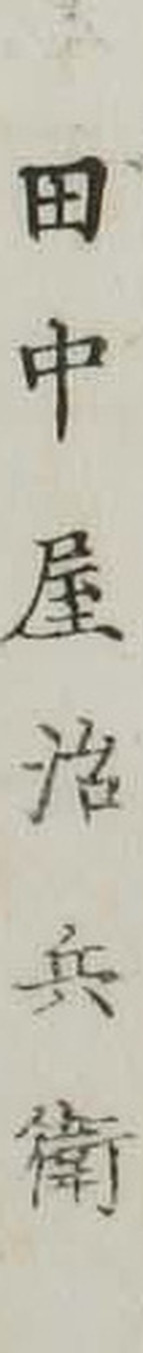田中屋治兵衛
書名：開化往来
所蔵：東京学芸大学教育コンテンツアーカイブ
